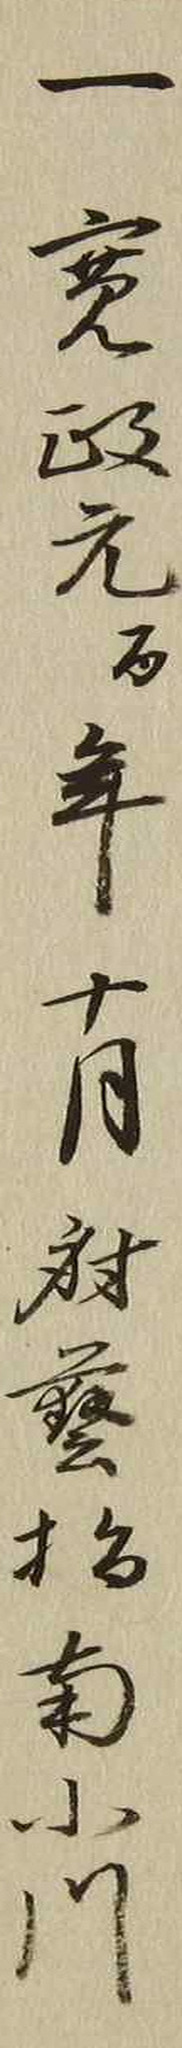一寛政元酉年十月射芸指南小川
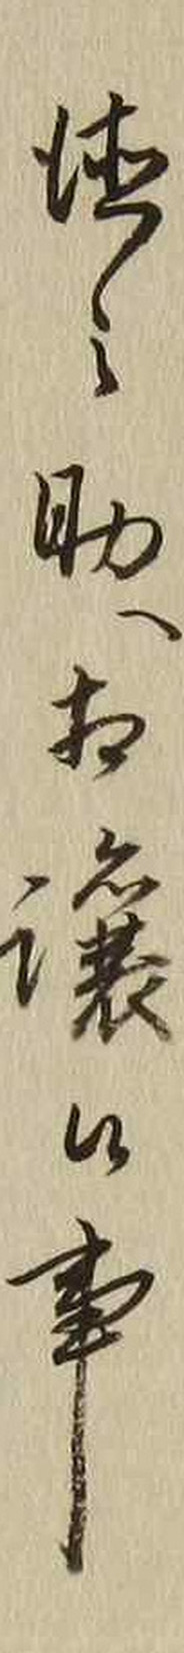徳之助へ相譲候事
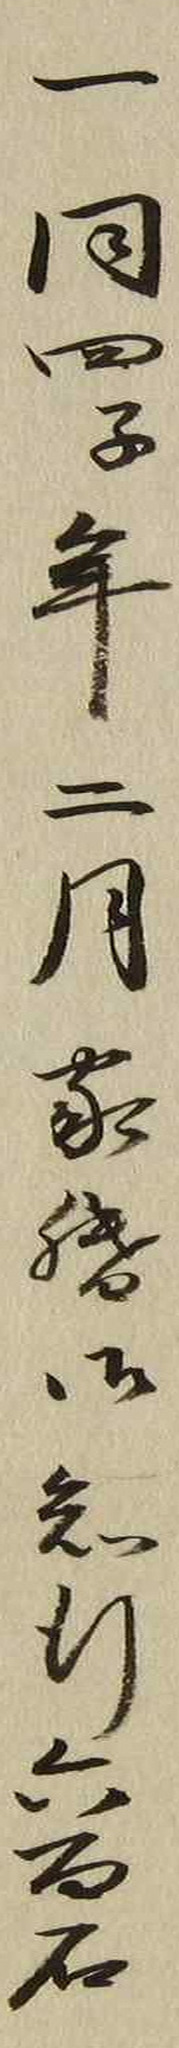一同四子年二月家督御知行六百石
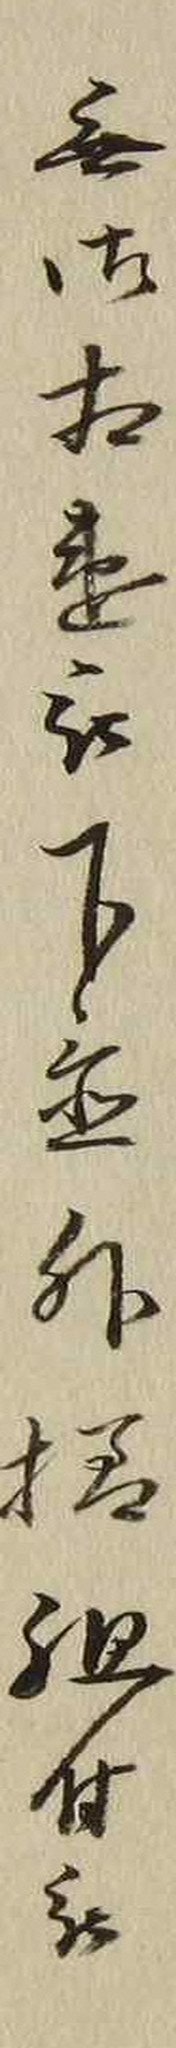無御相違被下置外様組付被
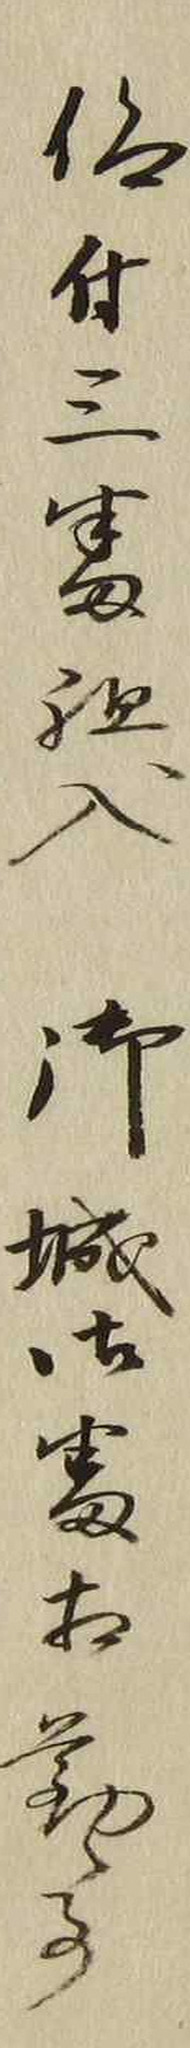仰付三番組へ入御城番相勤候事
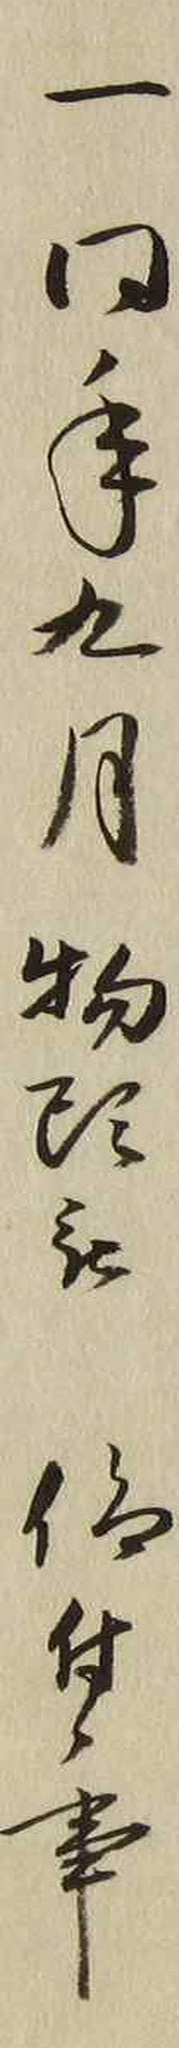一同年九月物頭被仰付候事
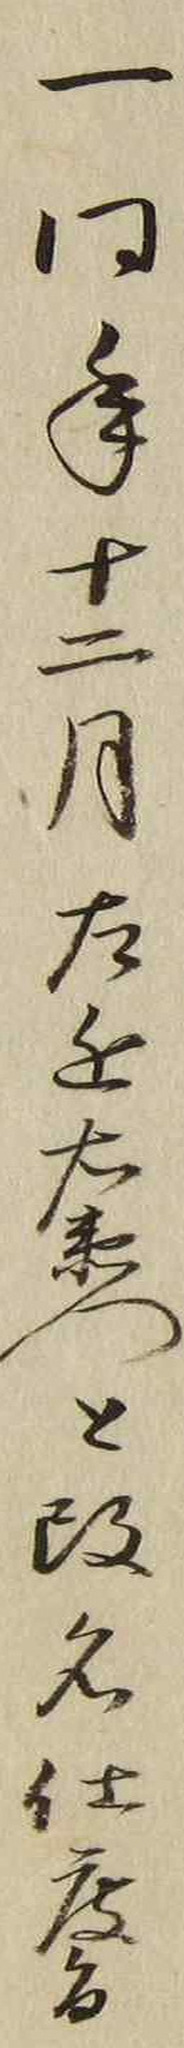一同年十二月左近右衛門と改名仕度旨
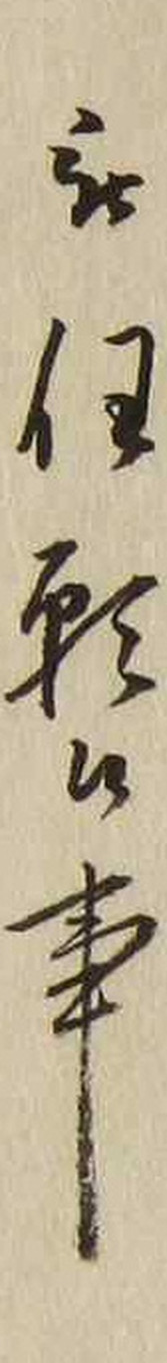被任願候事
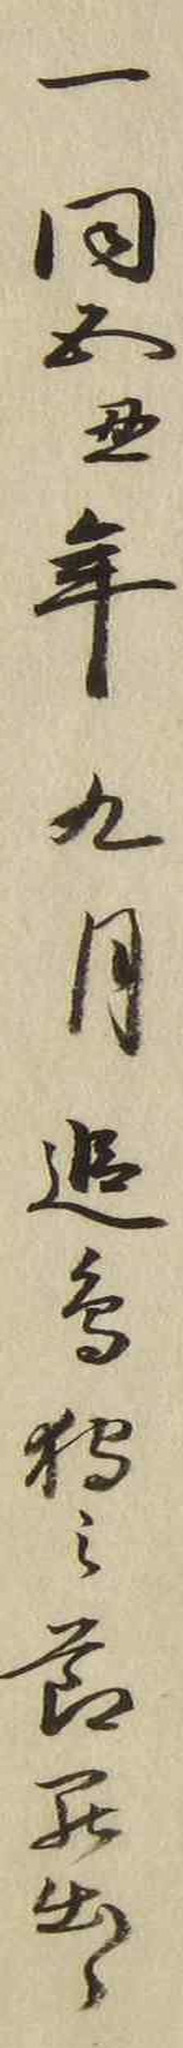一同五丑年九月追鳥狩之節罷出候

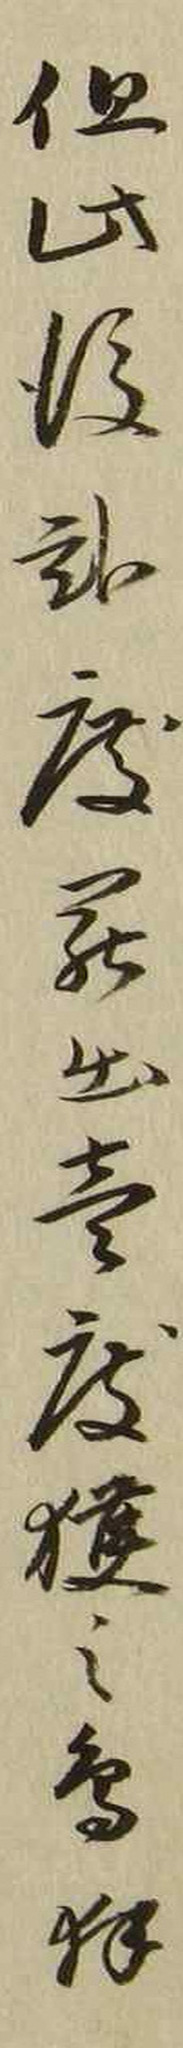但此度弐度罷出壱度獲之鳥拝
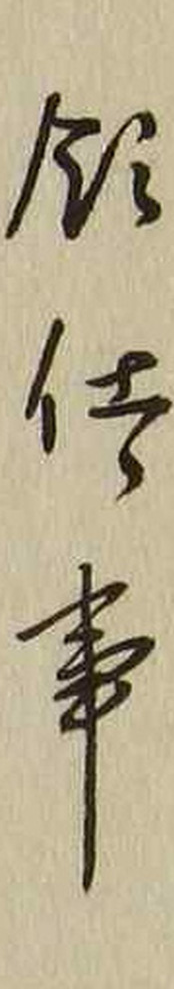領仕候事
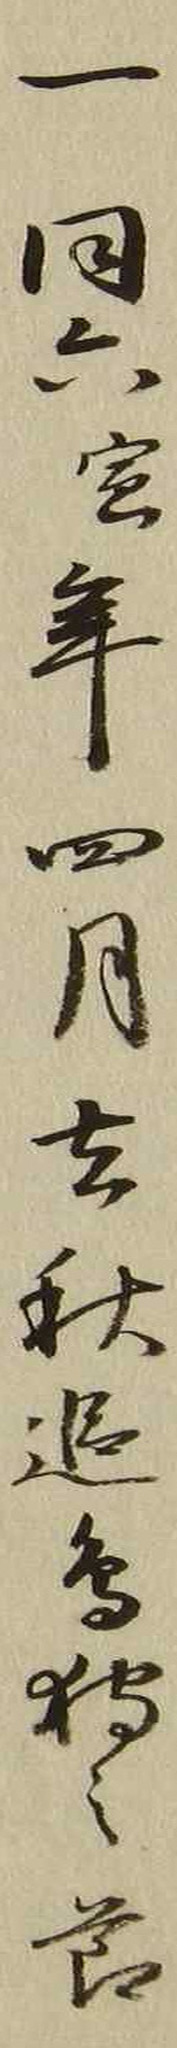一同六寅年四月去秋追鳥狩之節
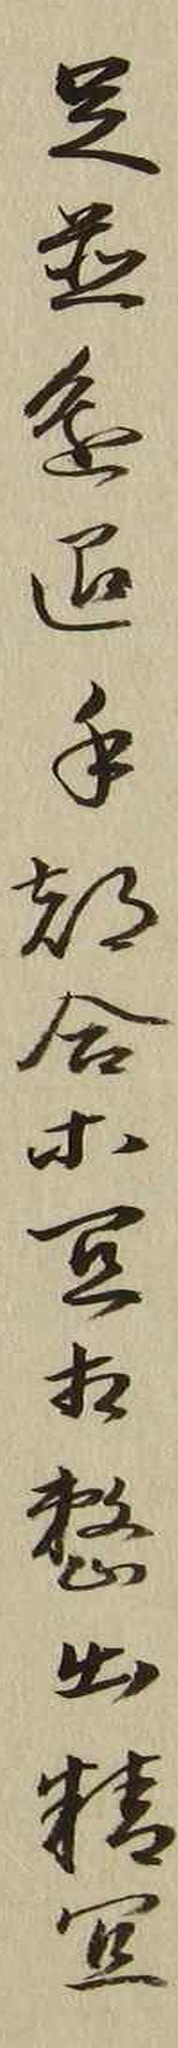足並進退手都合等宜相整出精宜
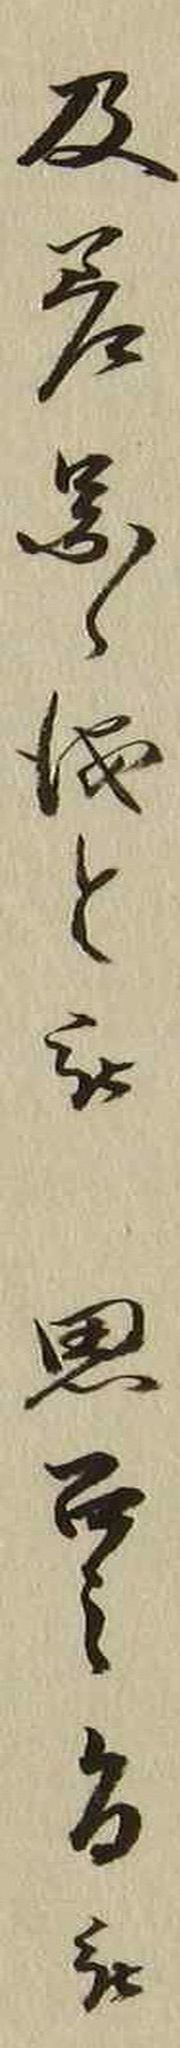及差図候儀と被思召之旨被
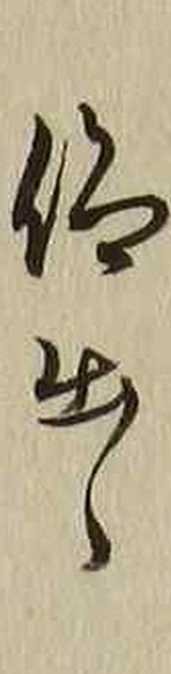仰出候
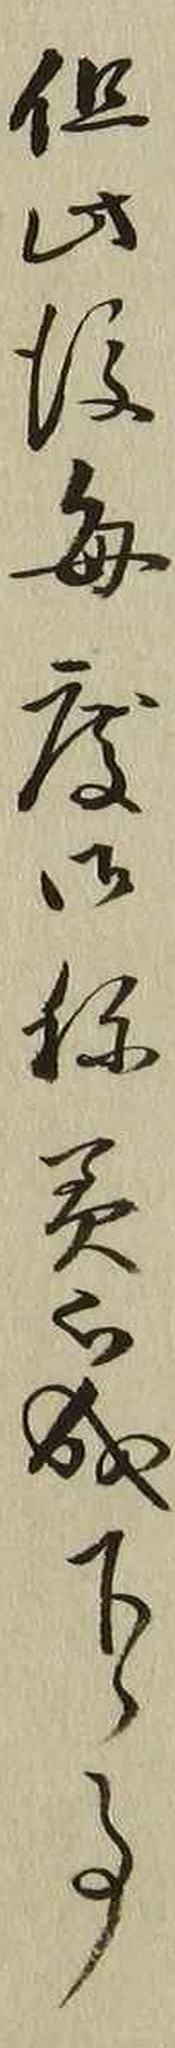但此度毎度御称美被成下候事
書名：諸士系譜　巻之69　を之部3
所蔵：会津若松市立会津図書館
